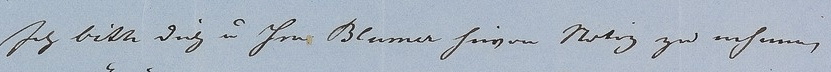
Ich bitte Dich u Hrn Blumer hievon Notiz zu nehmen,
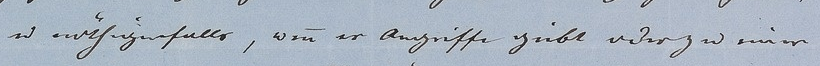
u nöthigenfalls, wenn es Angriffe giebt oder zu einer
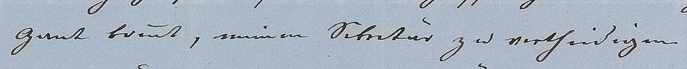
Gant kommt, meinen Sekretär zu vertheidigen.
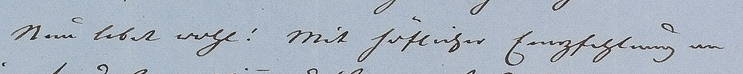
Nun lebet wohl! Mit höflicher Empfehlung an
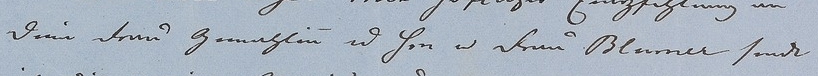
Deine Frau Gemahlin u Hrn u Frau Blumer sende
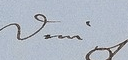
Dein
